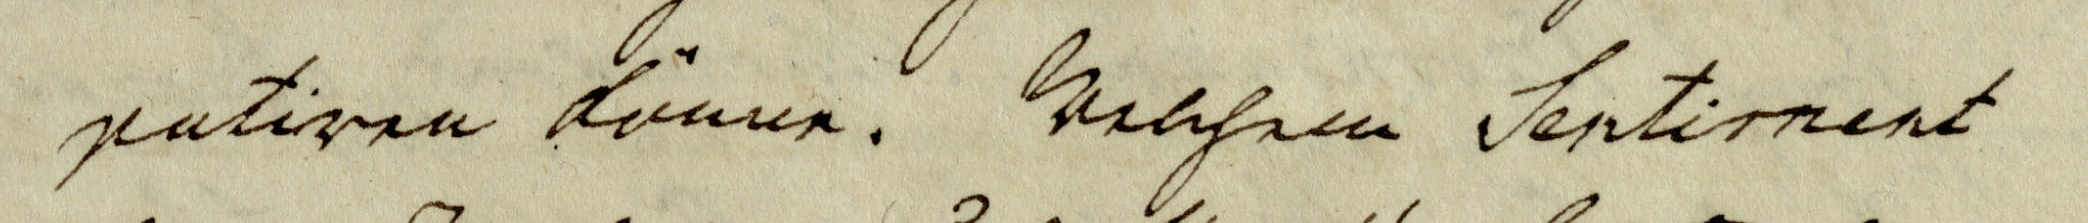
putiren könne. Welchem Sentiment
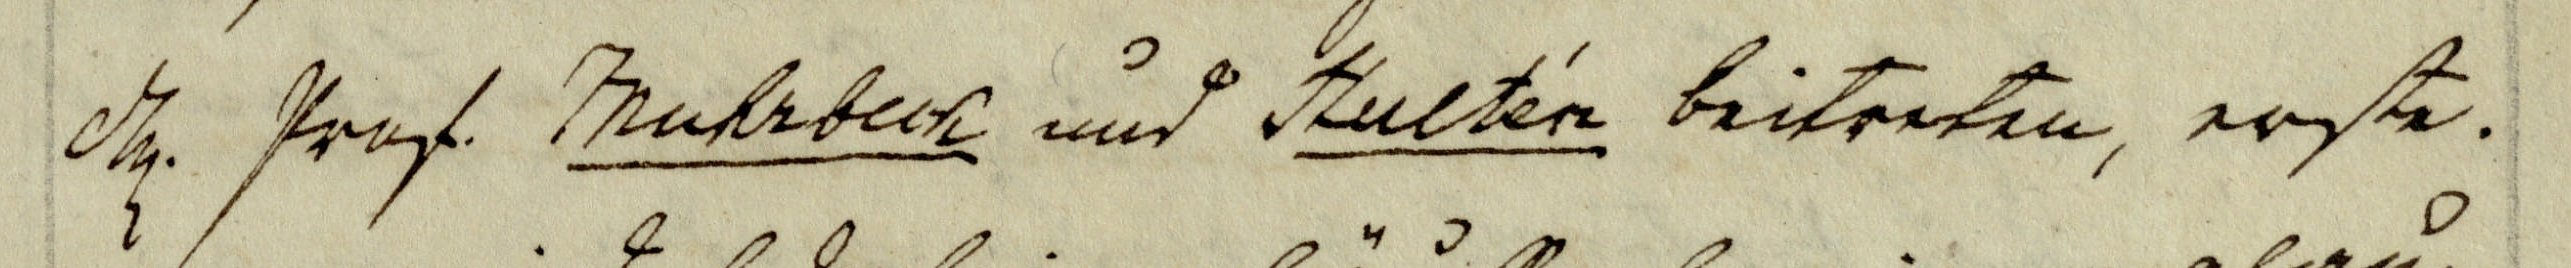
dh. Prof. Muhrbeck und Hultén beitreten, erste¬
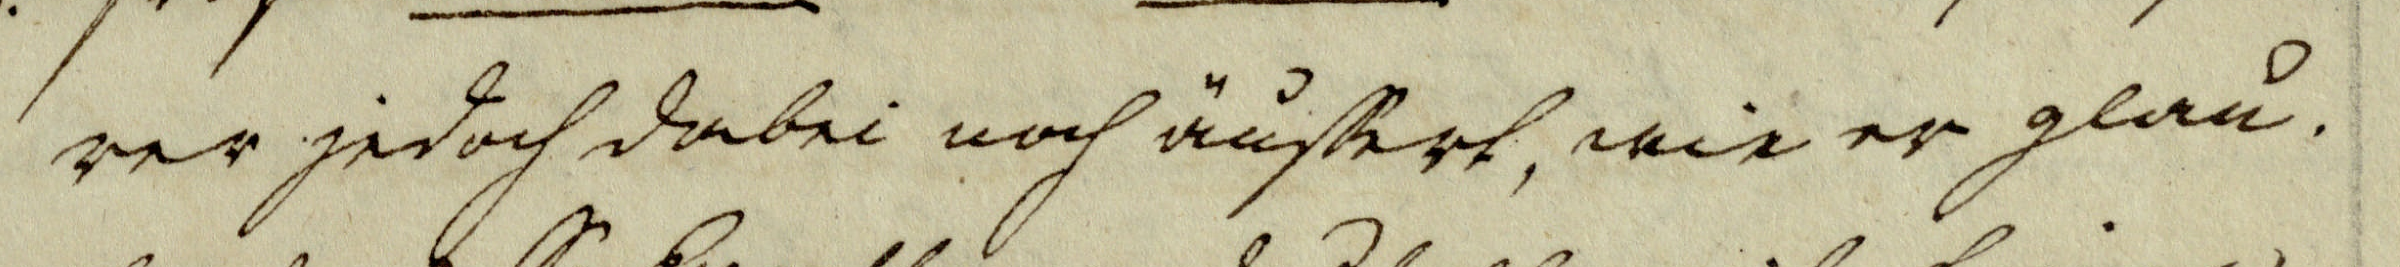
rer jedoch dabei noch äussert, wie er glau¬
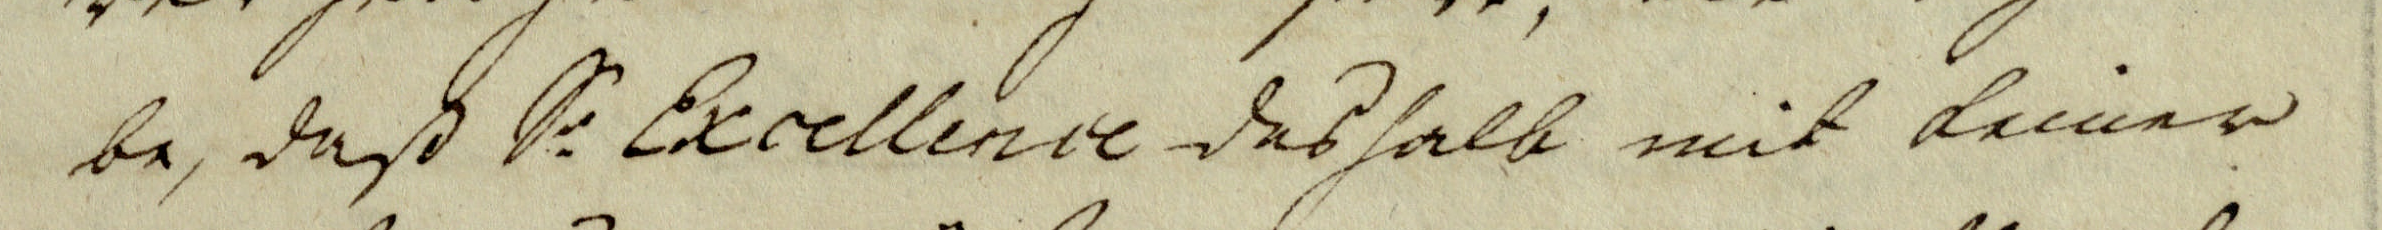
be, daß Sr Excellence deshalb mit keiner
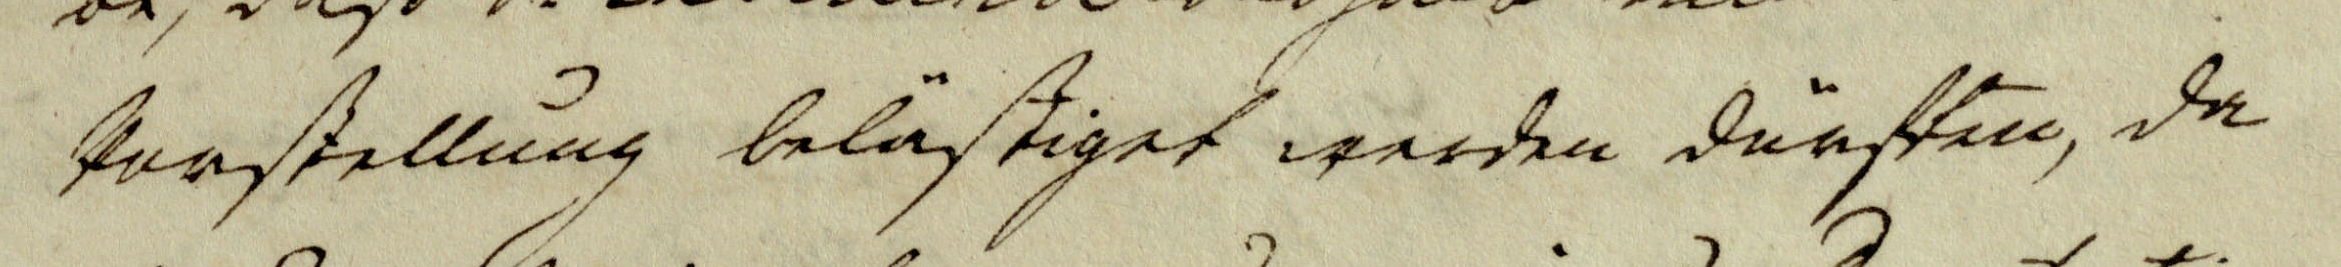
Vorstellung belästiget werden dürften, da
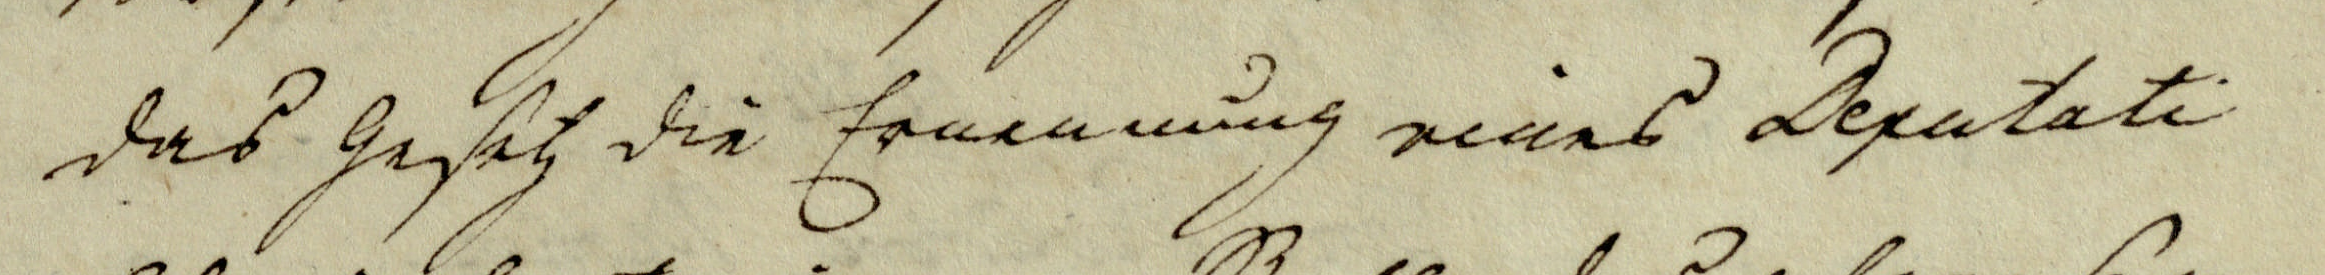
das Gesetz die Ernennung eines Deputati
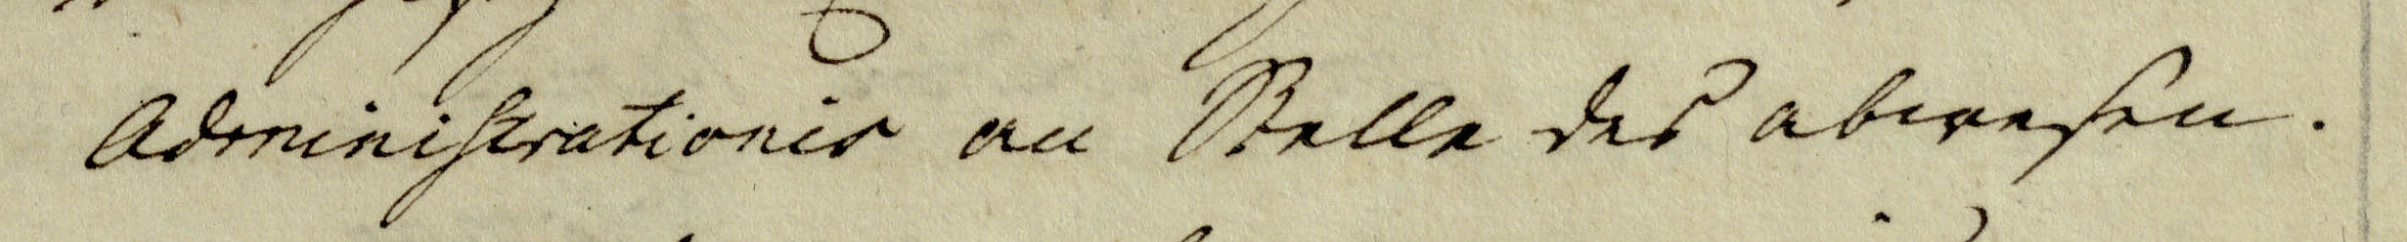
Administrationis an Stelle des abwesen-
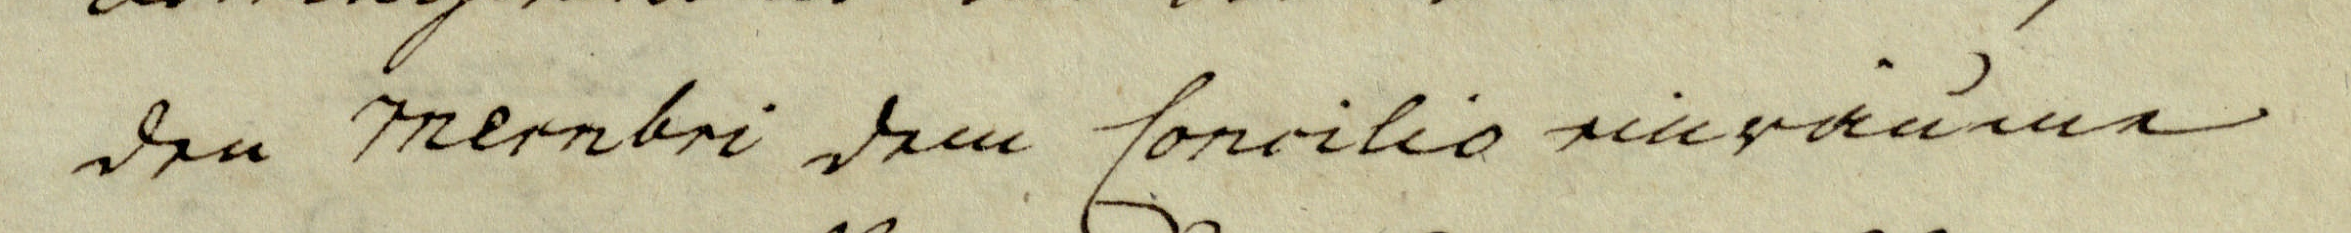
den membri dem Concilio einräume
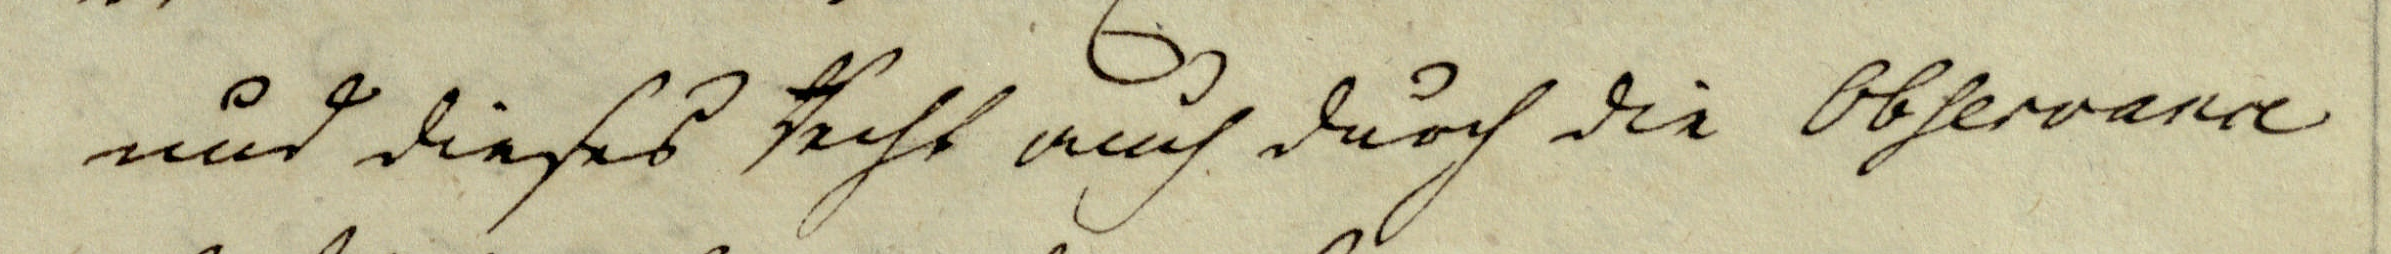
und dieses Recht auch durch die Observance
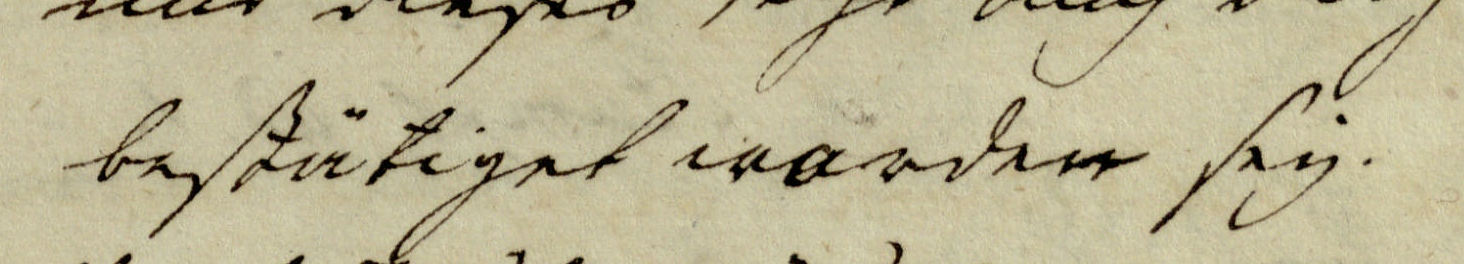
bestätiget worden seÿ.
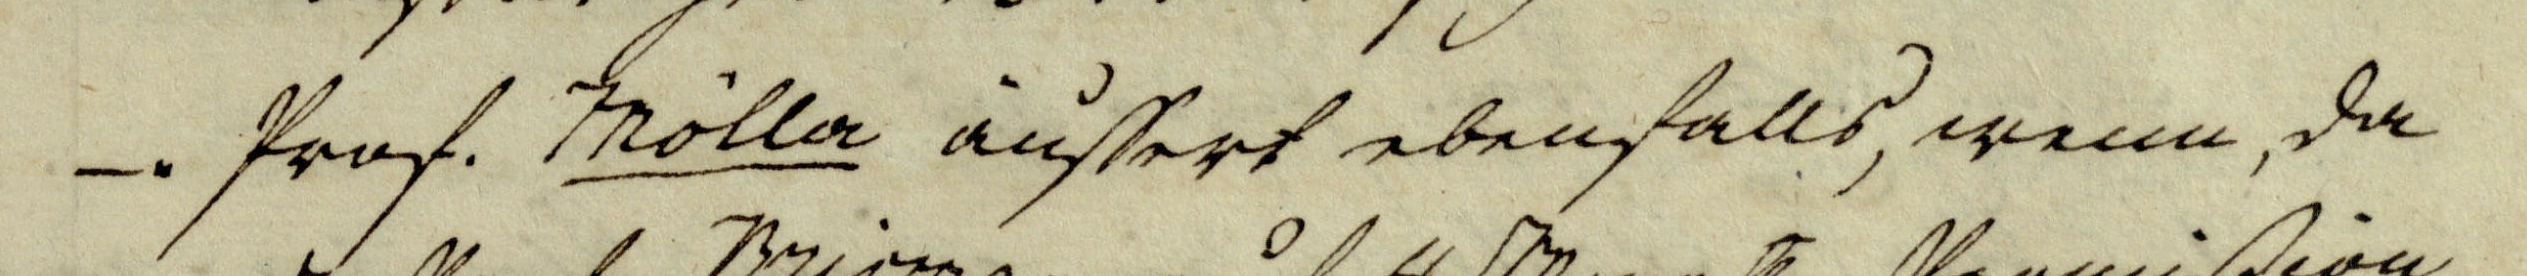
Prof. Möller äussert ebenfalls, wenn, da
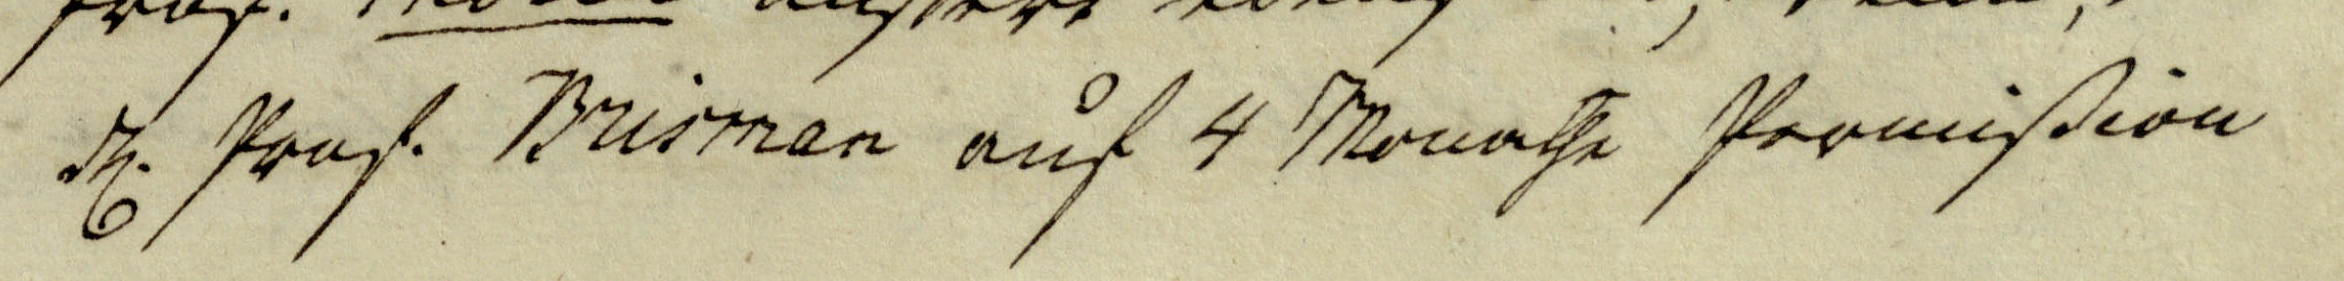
dh. Prof. Brisman auf 4 Monathe Permißion
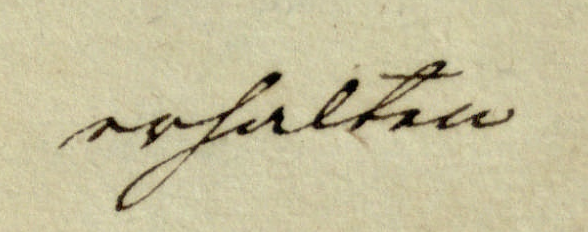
erhalten
